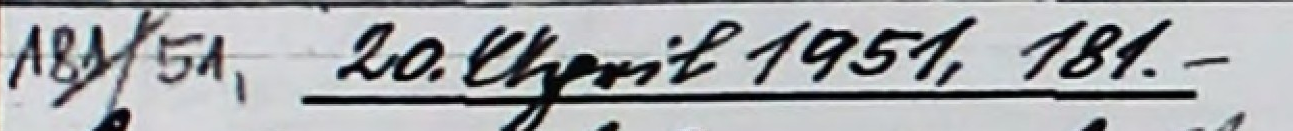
181/51, 20. April 1951, 181. -
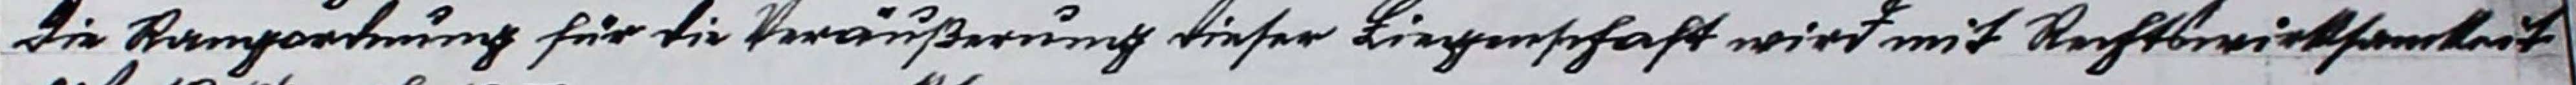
Die Rangordnung für die Veräußerung dieser Liegenschaft wird mit Rechtswirksamkeit
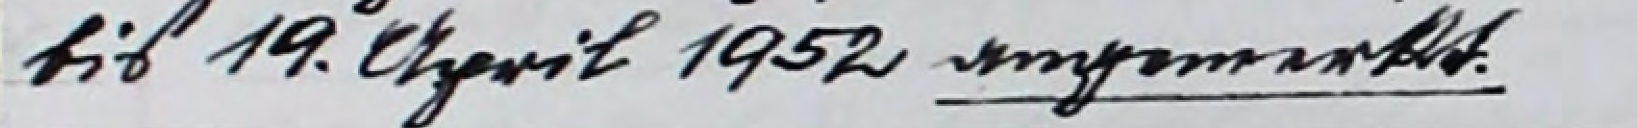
bis 19. April 1952 angemerkt.
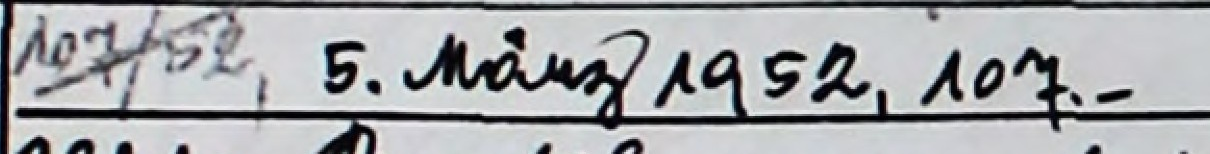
107/52, 5. März 1952, 107.-
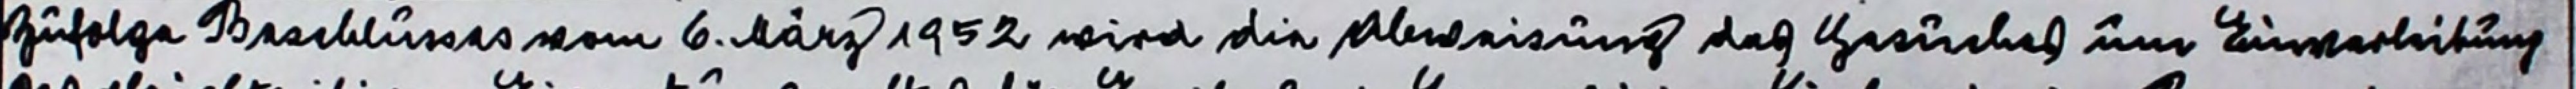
Zufolge Beschlusses vom 6. März 1952 wird die Abweisung des Gesuches um Einverleibung
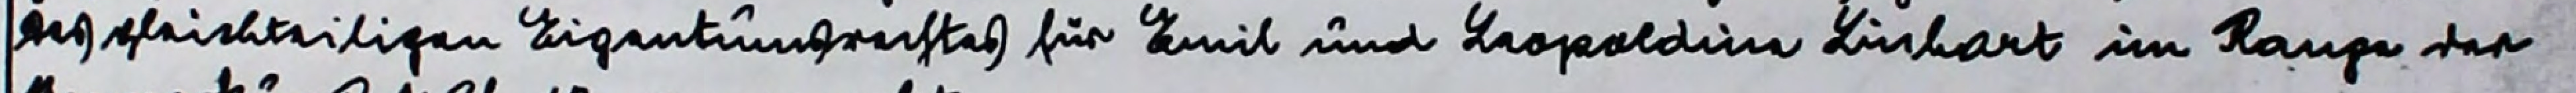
des engleichteiligen Eigentumsrechtes für Emil und Leopoldine Linhart im Range der
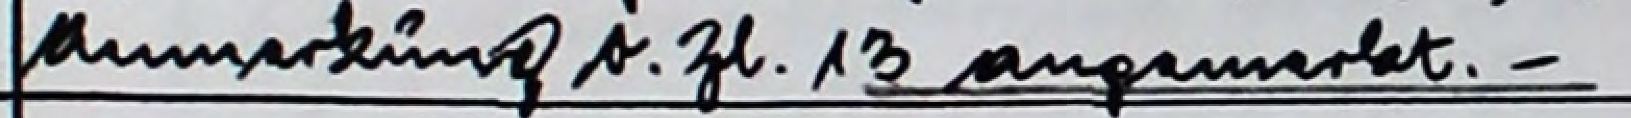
Anmerkung v. Zl. 13 angemerkt. -
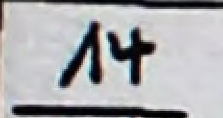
14
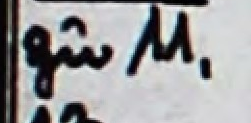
zu 11,
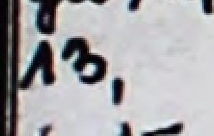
13,
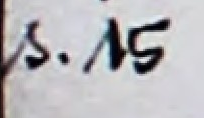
s. 15
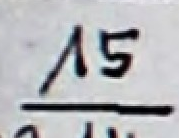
15
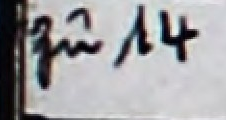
zu 14
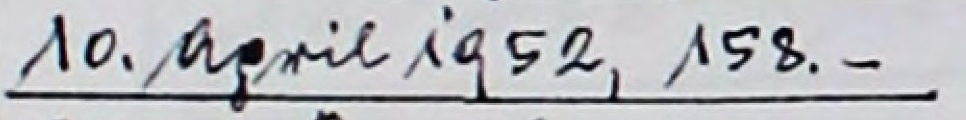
10. April 1952, 158. -
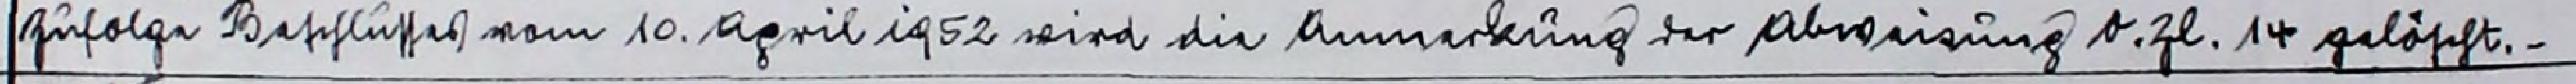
Zufolge Beschlusses vom 10. April 1952 wird die Anmerkung der Abweisung v. Zl. 14 gelöscht. -
